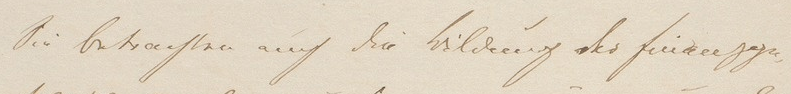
Sie betrachten auch die Bildung der Finanzge-
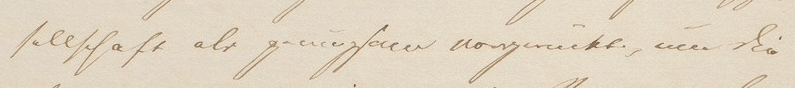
sellschaft als genügsam vorgerückt, um die
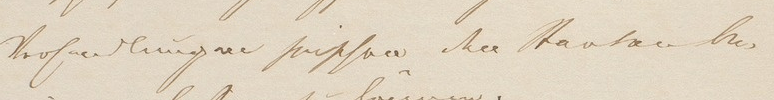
Verhandlungen zwischen den Staaten be-
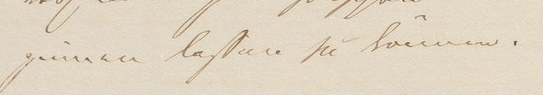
ginnen laßen zu können.
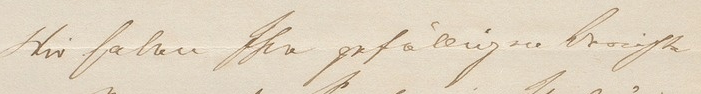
Wir haben Ihre gefälligen Berichte
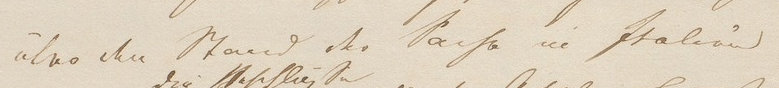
über den Stand der Sache in Italien
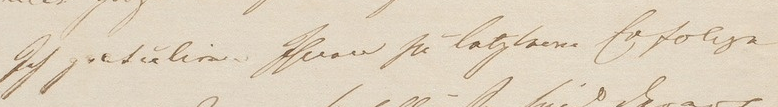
Ich gratulire Ihnen zu letzterm Erfolge
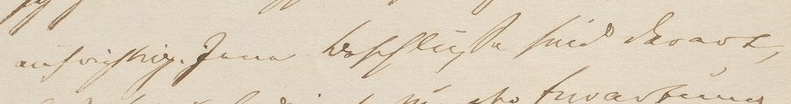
aufrichtig. Jene Beschlüße sind derart,
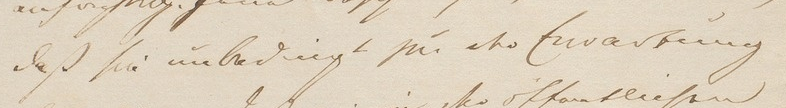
daß sie unbedingt zu der Erwartung
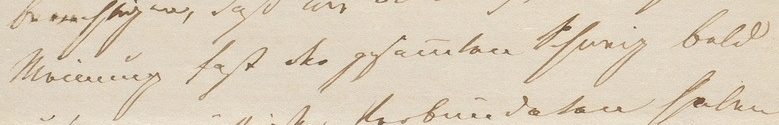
Meinung fast der gesammten Schweiz bald
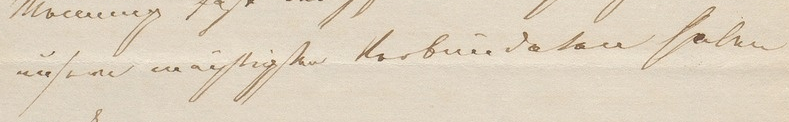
unsere mächtigsten Verbündeten haben
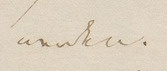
werden.
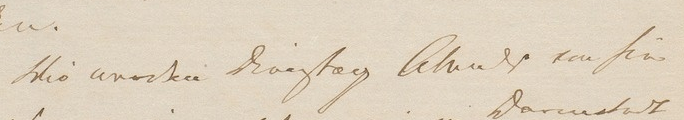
Wir werden Dienstag Abends von hier
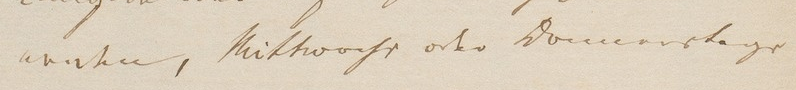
werden, Mittwochs oder Donnerstags
